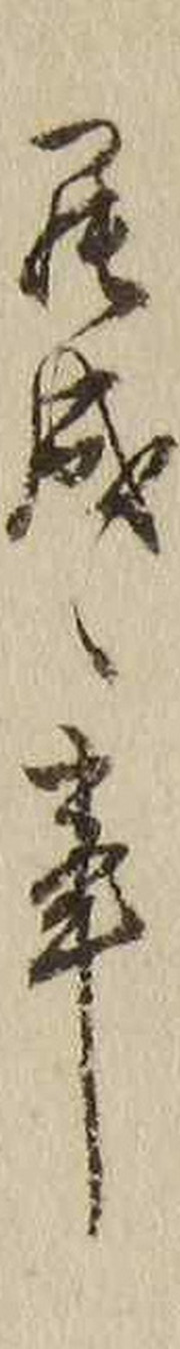罷成候事
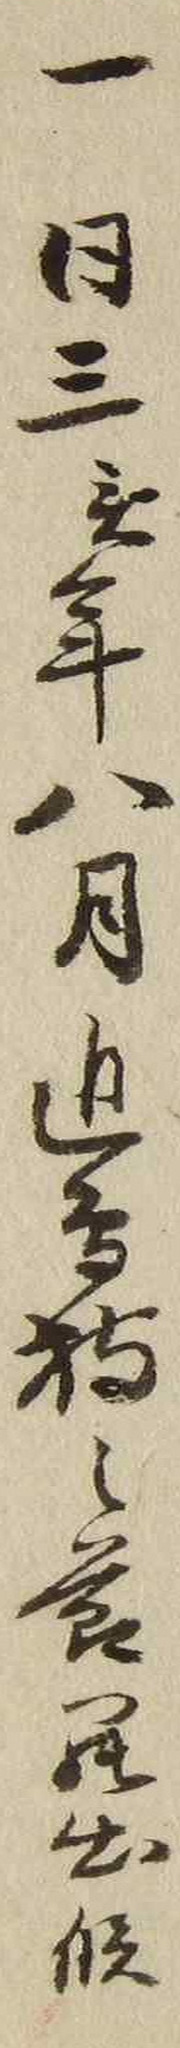一同三亥年八月追鳥狩之節罷出候
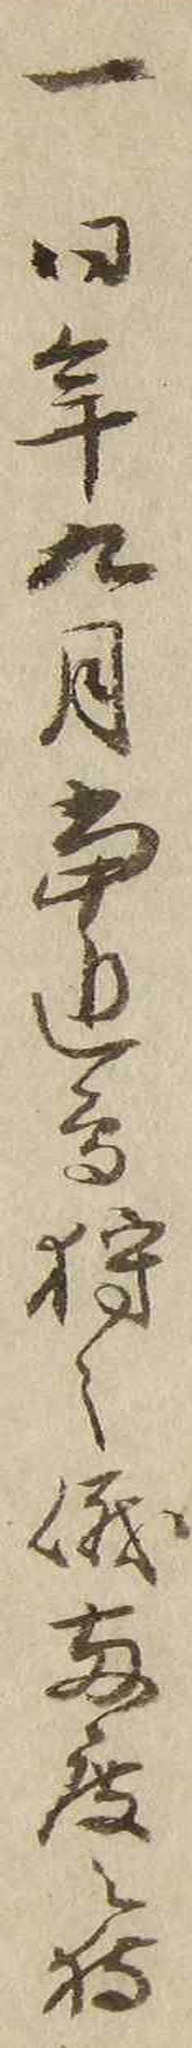一同年九月当追鳥狩之儀両度之狩

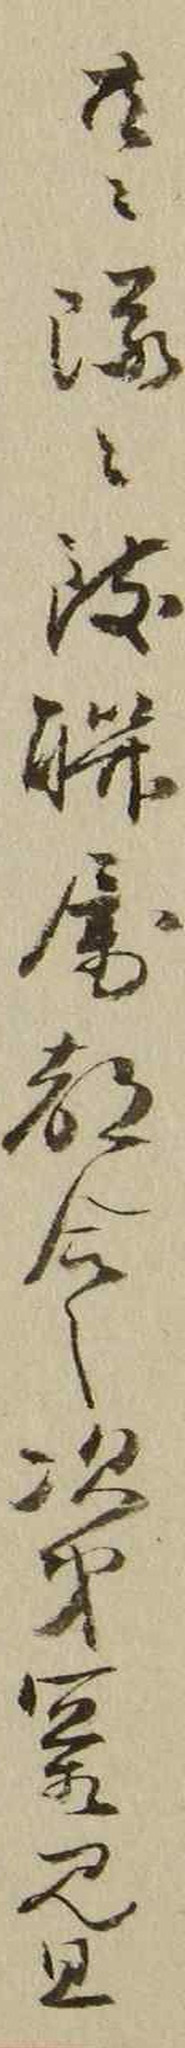共々隊々致聯属都合之次第宜相見且
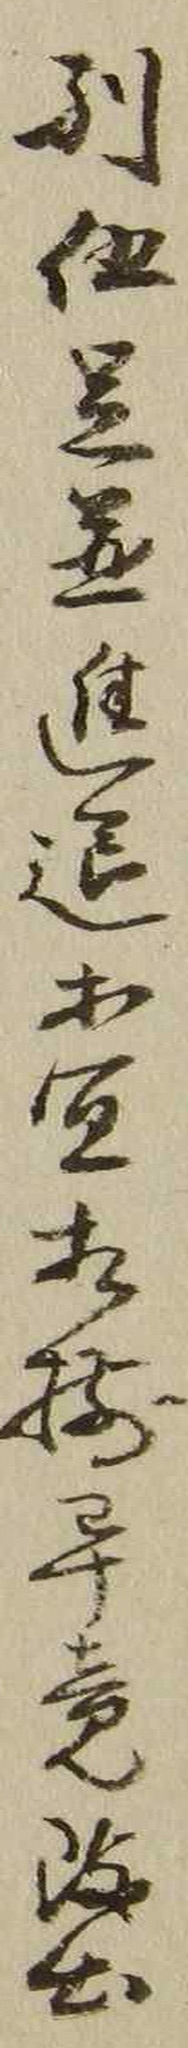列伍足並進退等宜相揃畢竟致出
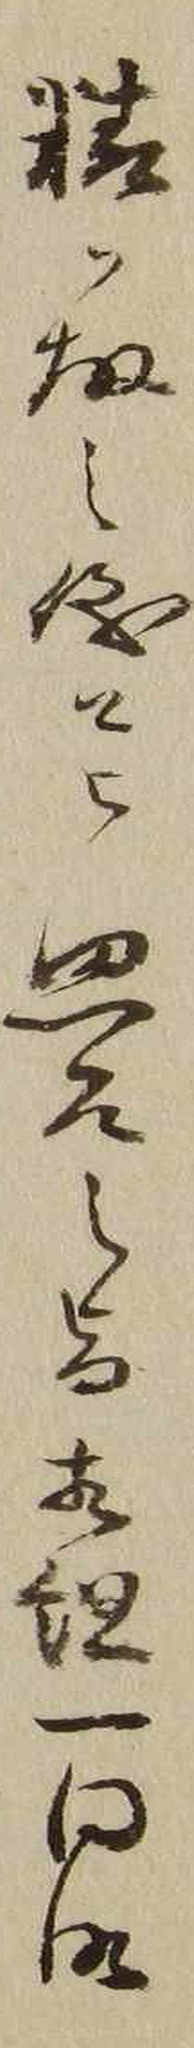精候故之儀と被思召之旨相組一同御
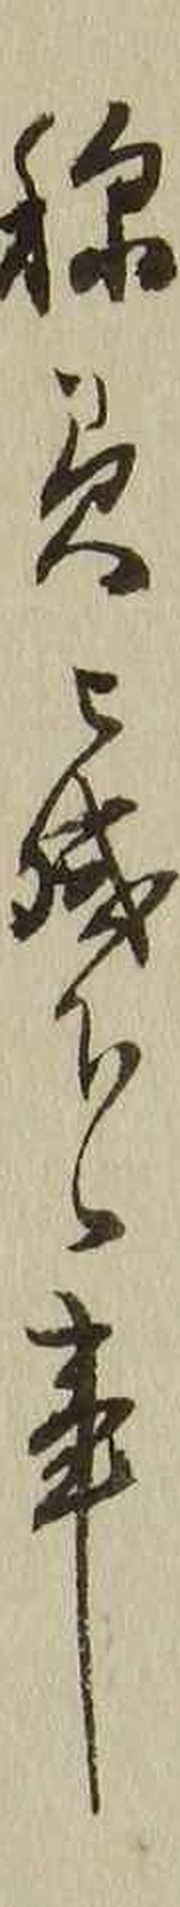称美被成下候事
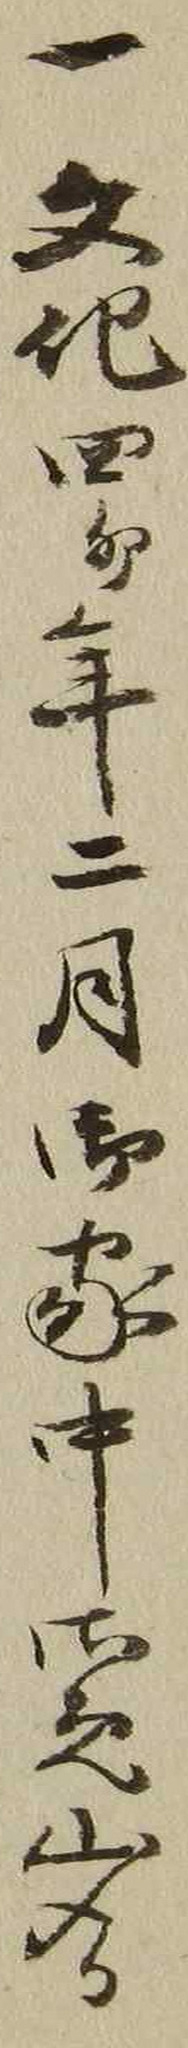一文化四卯年二月御家中御免山〆り
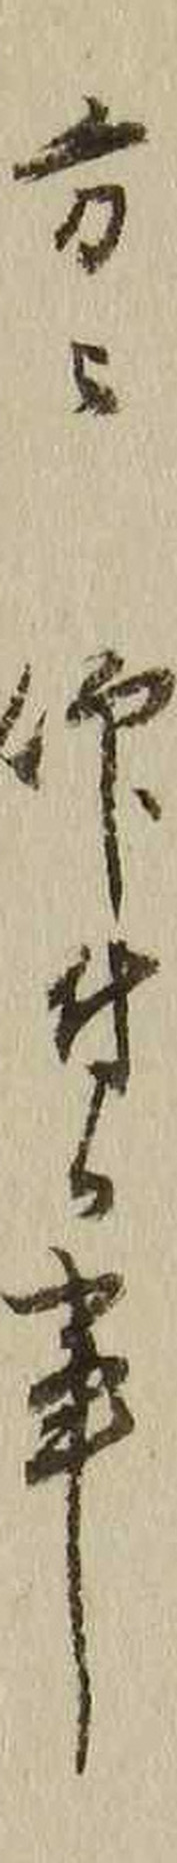方被仰付候事
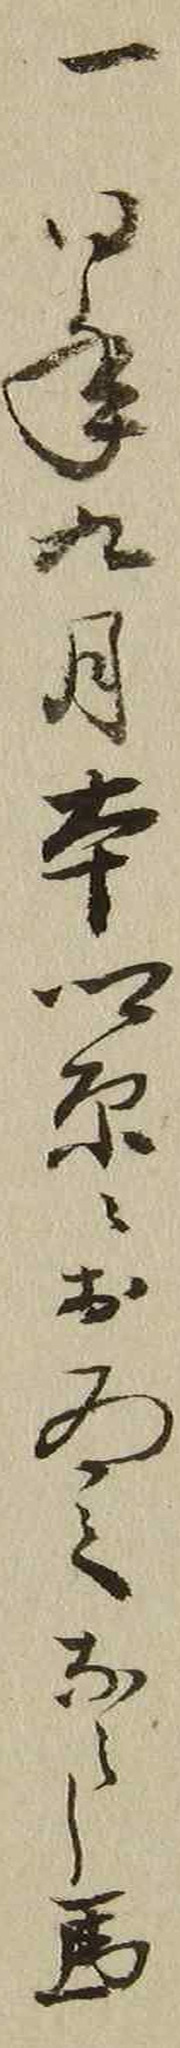一同年九月本郷原ニおゐてならし馬
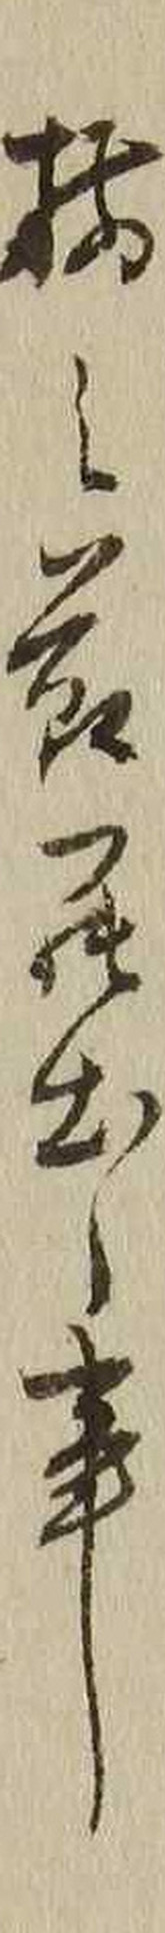揃之節罷出候事
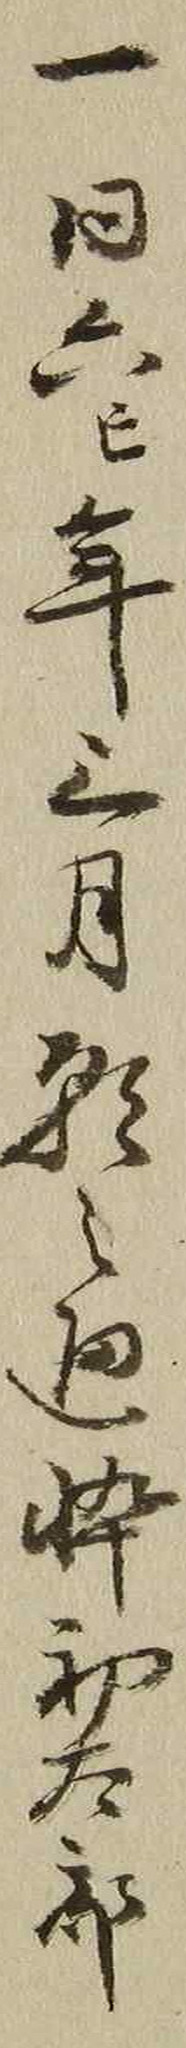一同六巳年三月願之通忰初太郎
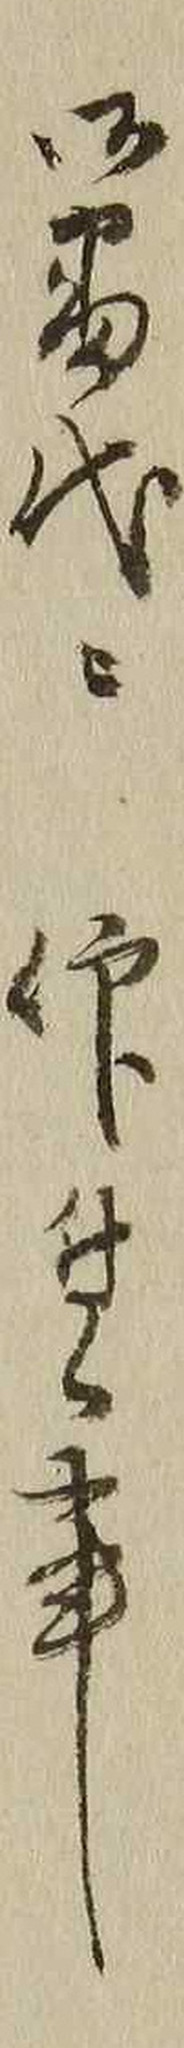御番代被仰付候事
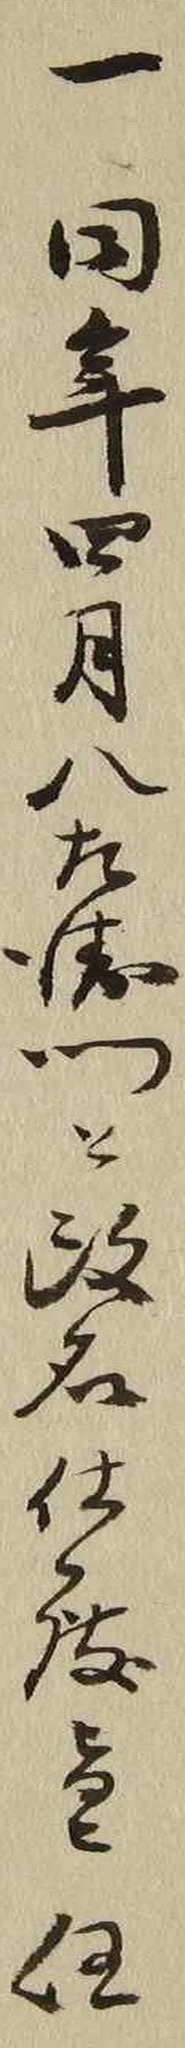一同年四月八左衛門と改名仕度旨被任
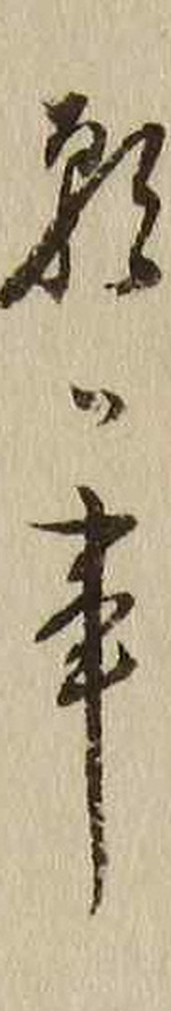願候事
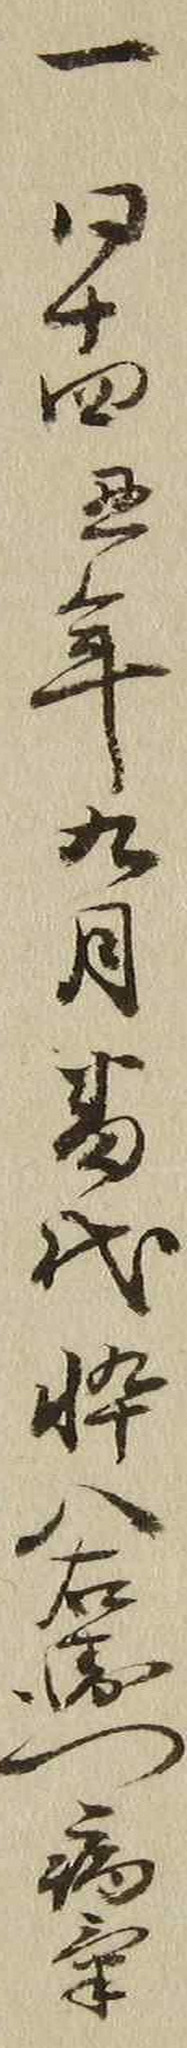一同十四丑年九月番代忰八右衛門病気
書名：諸士系譜　巻之232　け之部1
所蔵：会津若松市立会津図書館
